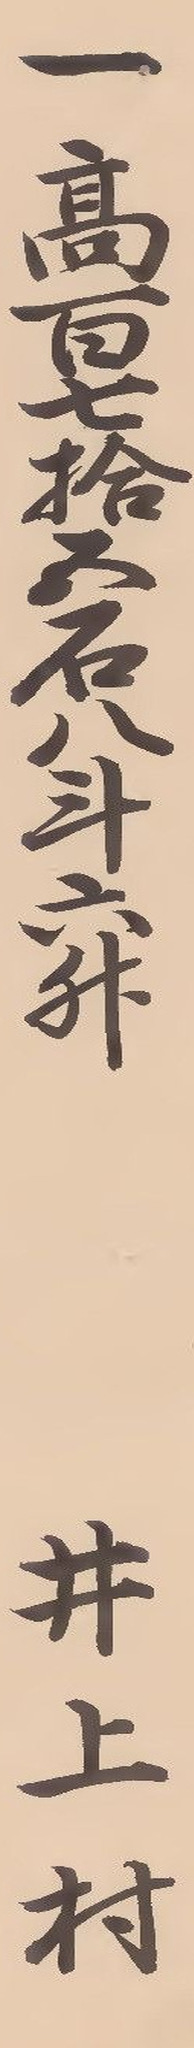一高百七拾五石八斗六升井上村
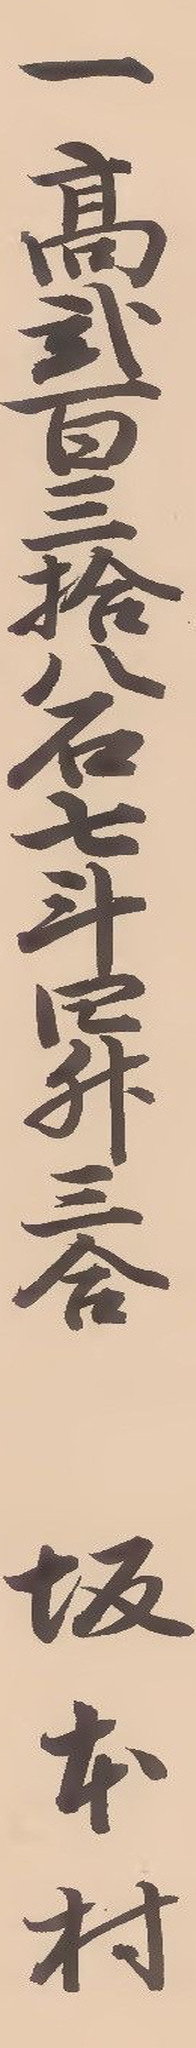一高弐百三拾八石七斗四升三合坂本村
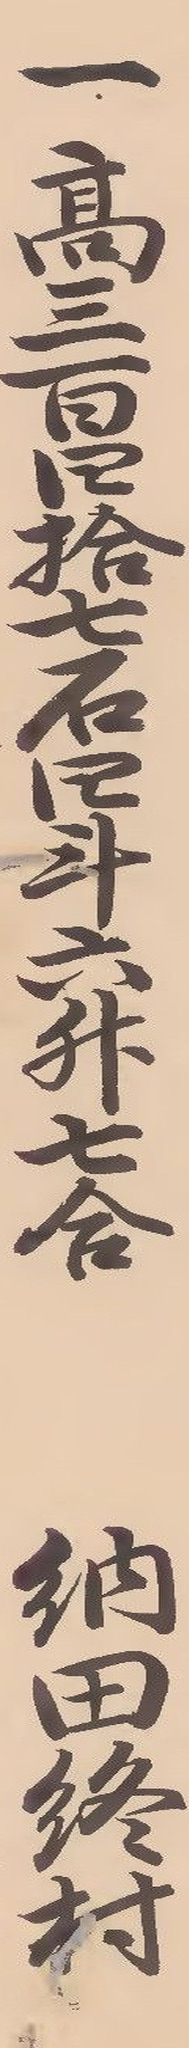一高三百四拾七石四斗六升七合納田終村

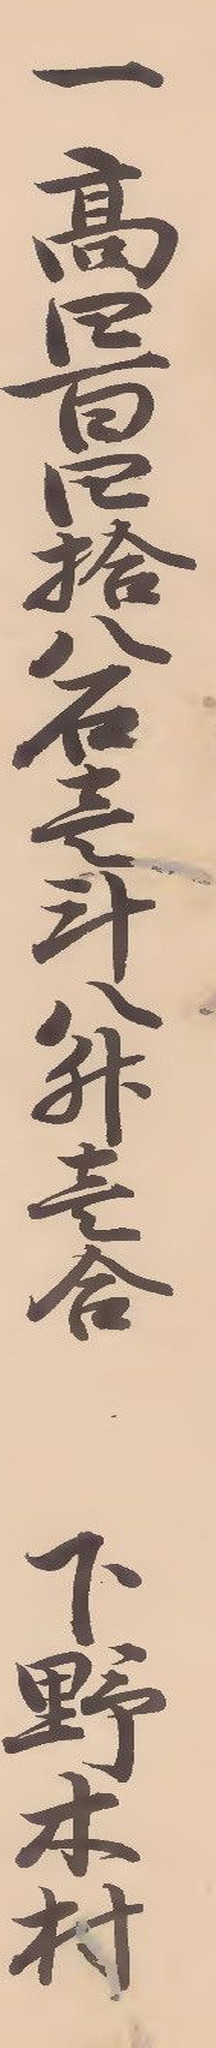一高四百四拾八石壱斗八升壱合下野木村
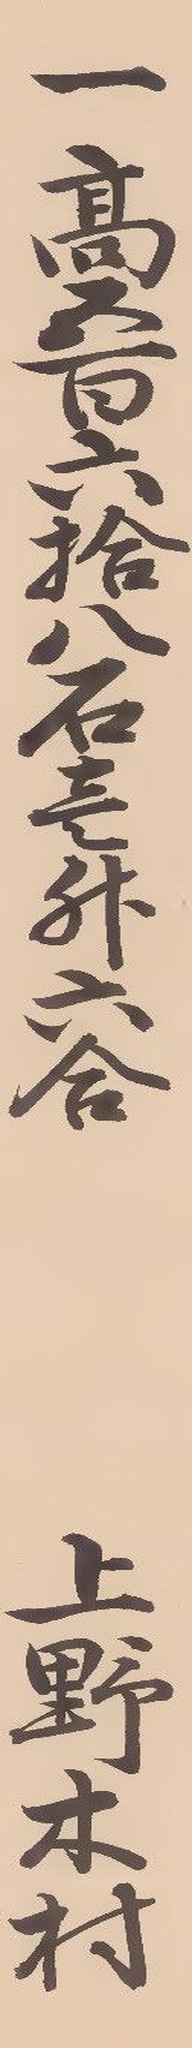一高五百六拾八石壱升六合上野木村
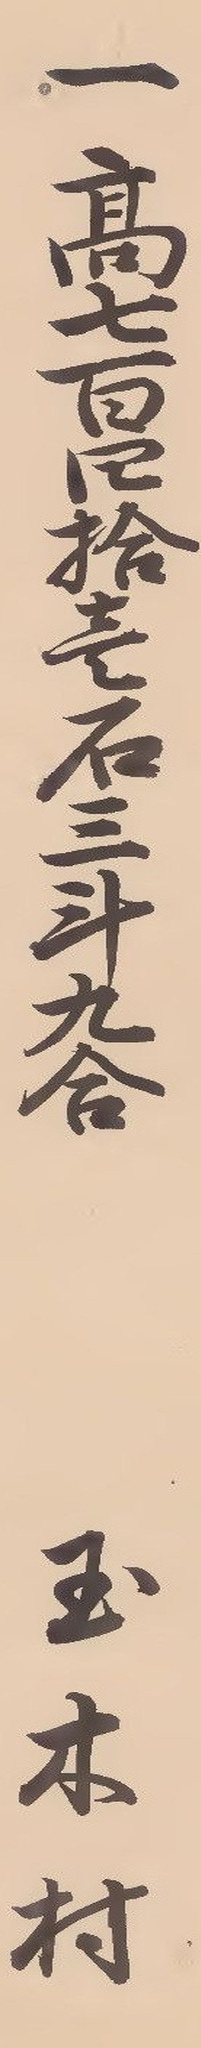一高七百四拾壱石三斗九合玉木村
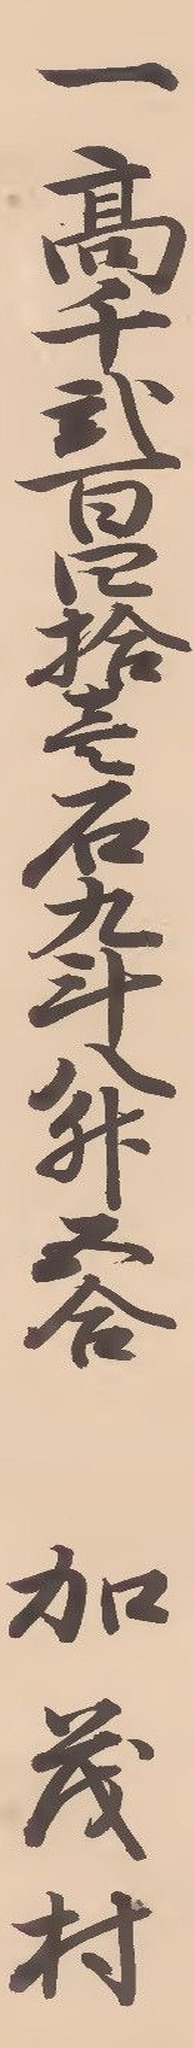一高千弐百四拾壱石九斗八升五合加茂村
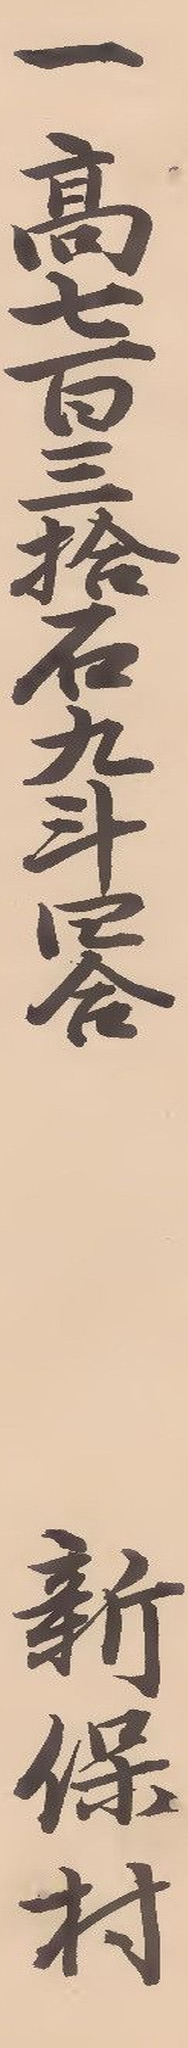一高七百三拾石九斗四合新保村
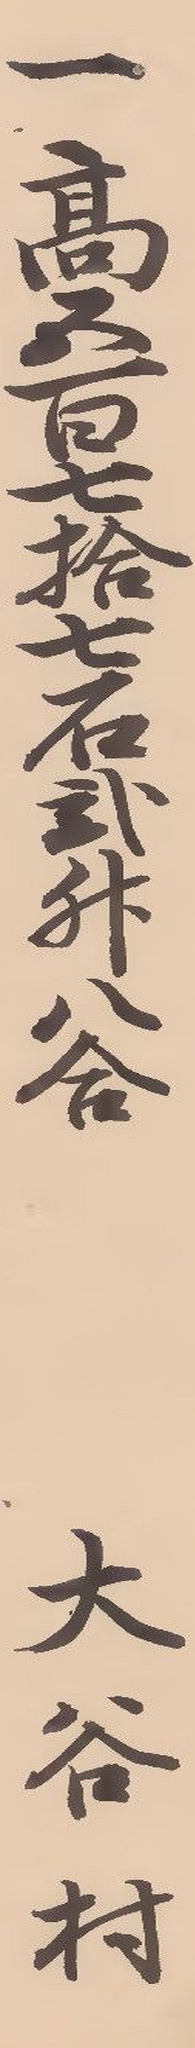一高五百七拾七石弐升八合大谷村
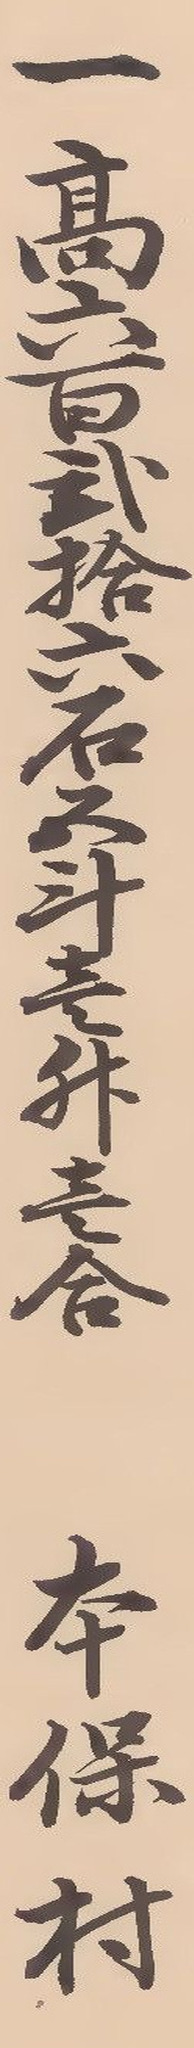一高六百弐拾六石五斗壱升壱合本保村
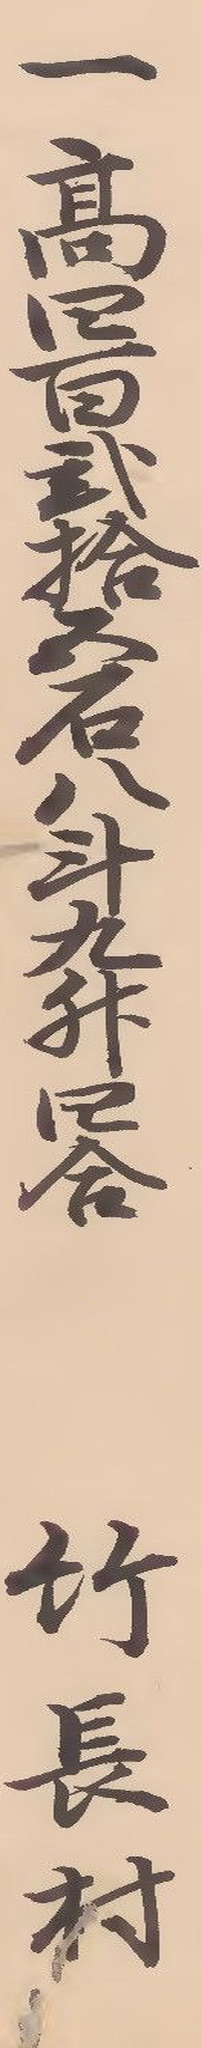一高四百弐拾五石八斗九升四合竹長村

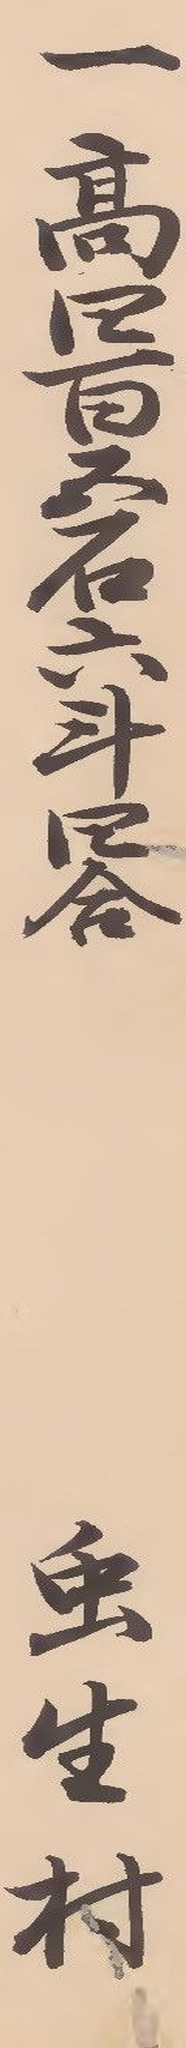一高四百五石六斗四合虫生村
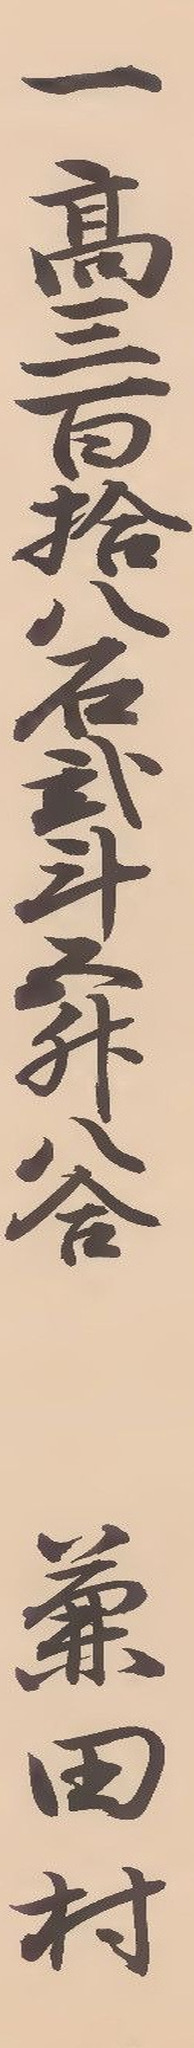一高三百拾八石弐斗五升八合兼田村
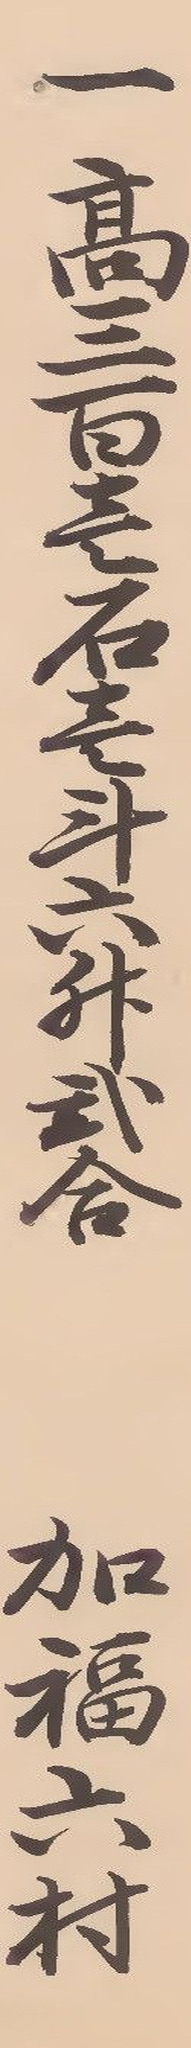一高三百壱石壱斗六升弐合加福六村
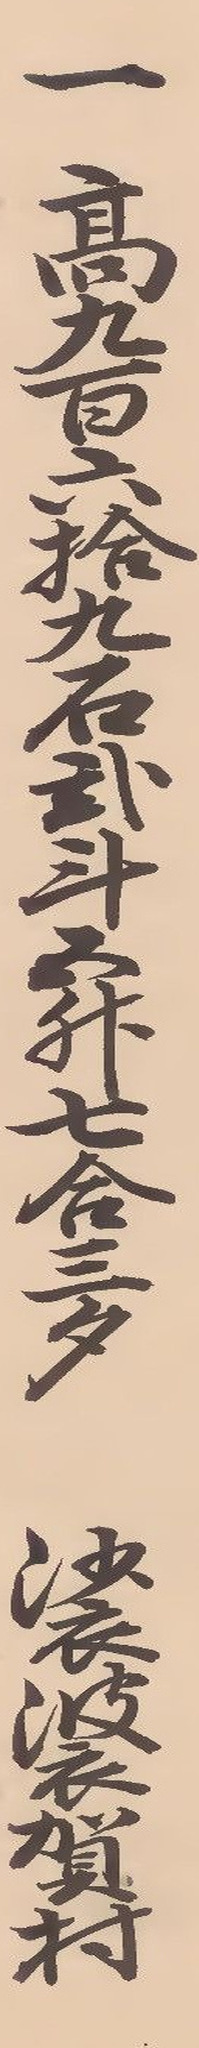一高九百六拾九石弐斗五升七合三勺裟賀村
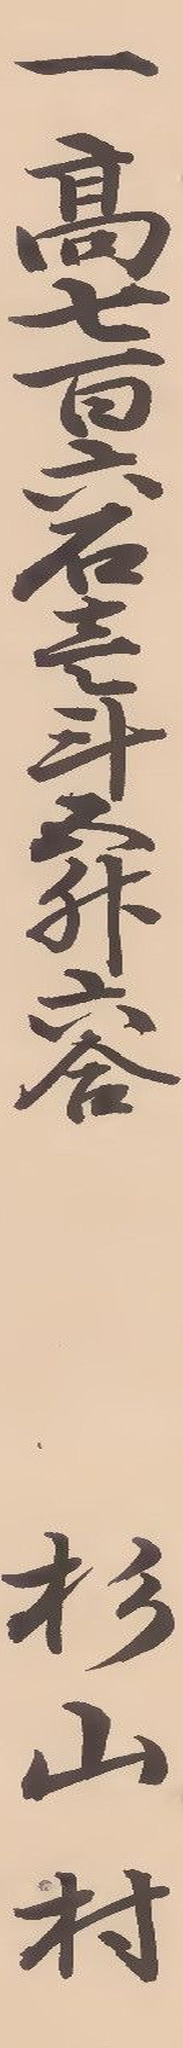一高七百六石壱斗五升六合杉山村
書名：若狭国郷帳
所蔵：国立公文書館 National Archives of Japan
